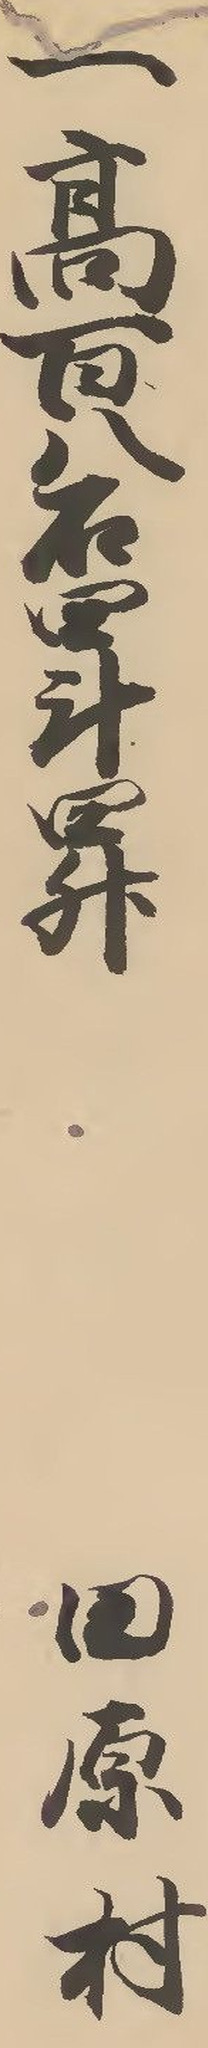一髙百八石四斗四升田原村

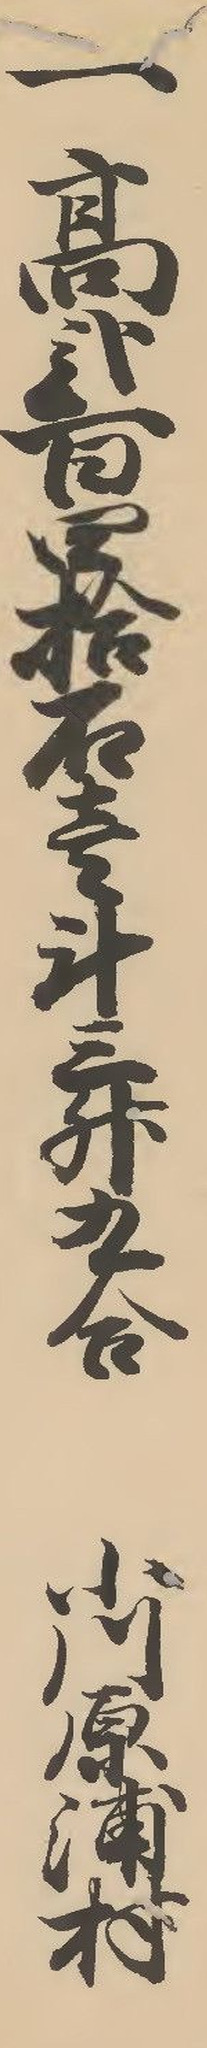一髙弐百四拾石壱斗三升九合小川原浦村
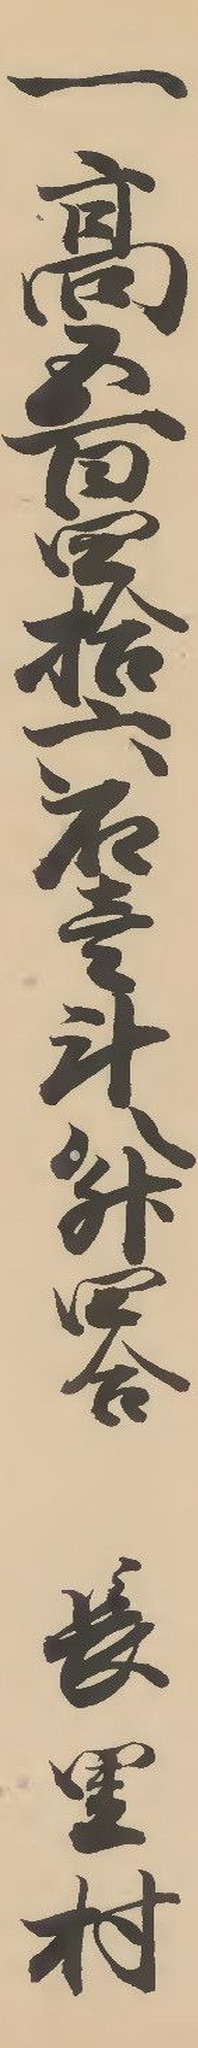一髙五百四拾六石壱斗八升四合長里村
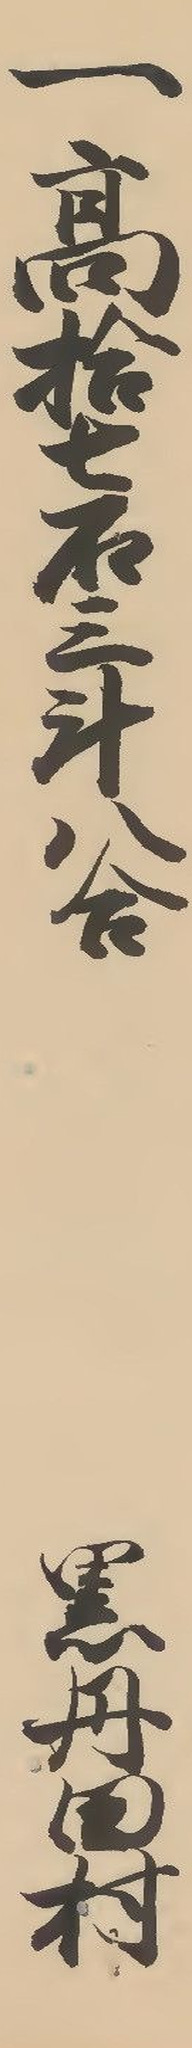一髙拾七石三斗八合黑丹田村
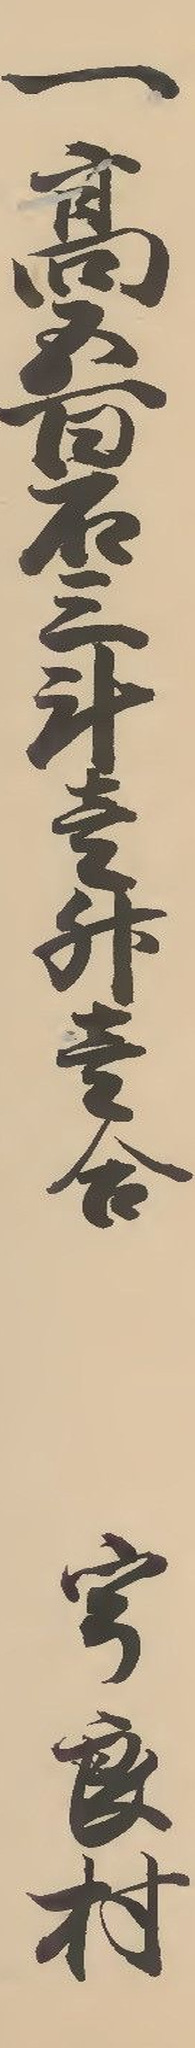一髙五百石三斗壱升壱合宇良村
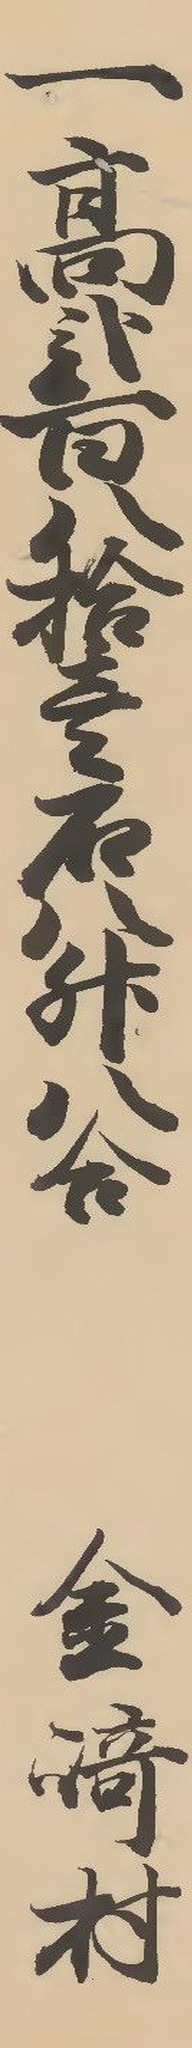一髙弐百八拾壱石八升八合金崎村
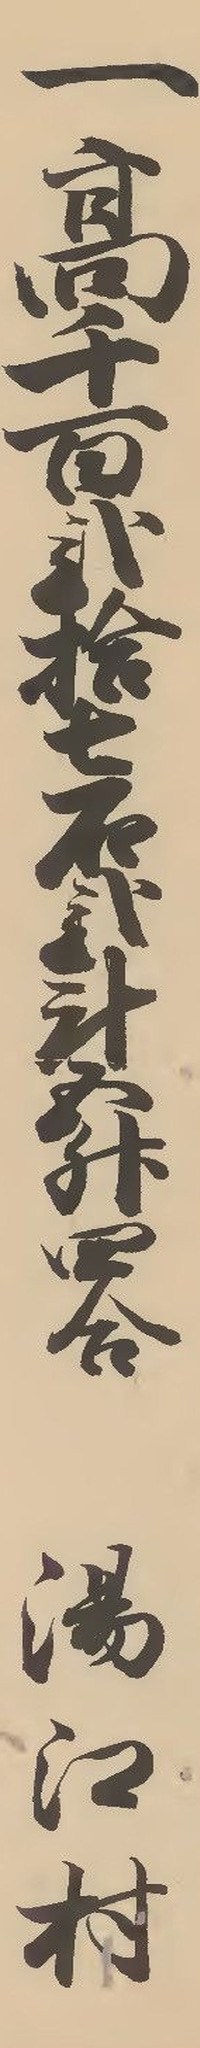一髙千百弐拾七石弐斗五升四合湯江村
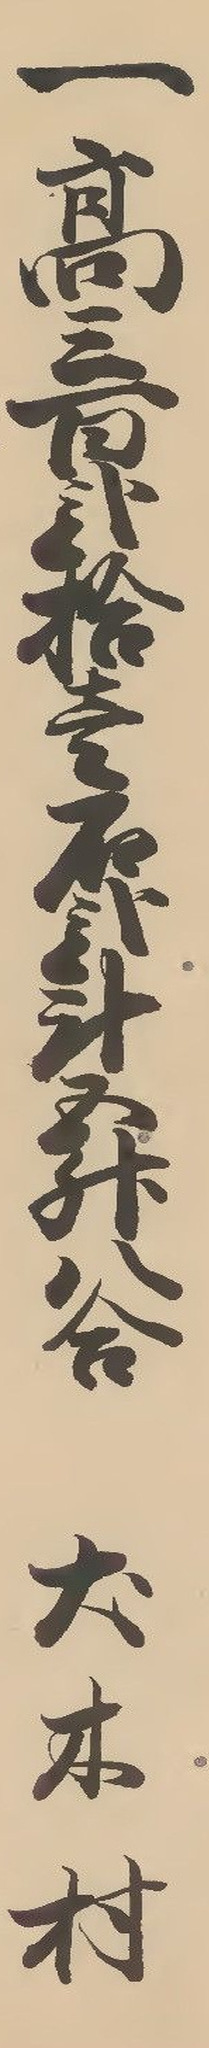一髙三百弐拾壱石弐斗五升八合犬木村
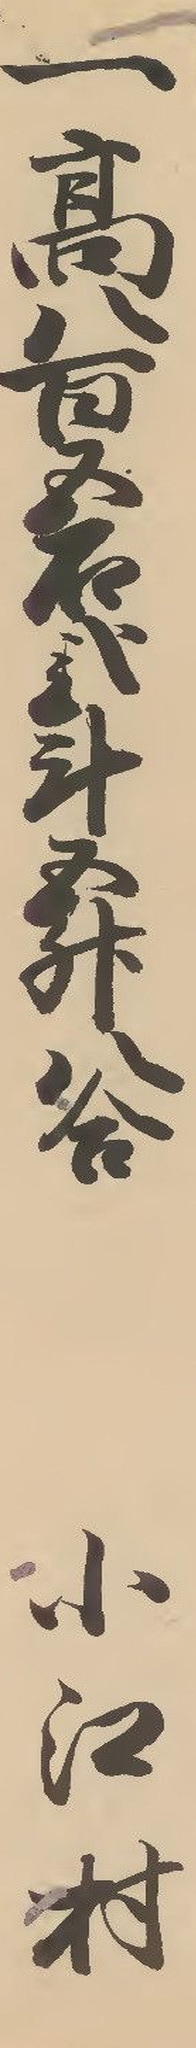一髙八百五石弐斗五升八合小江村

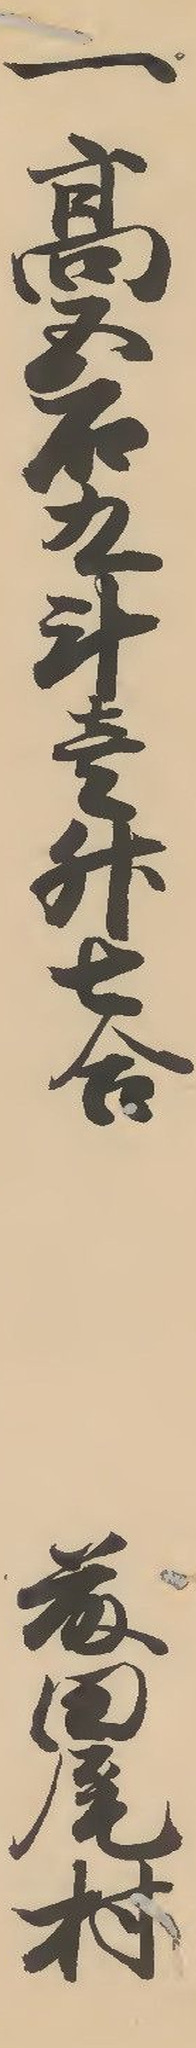一髙五石九斗壱升七合藤田尾村
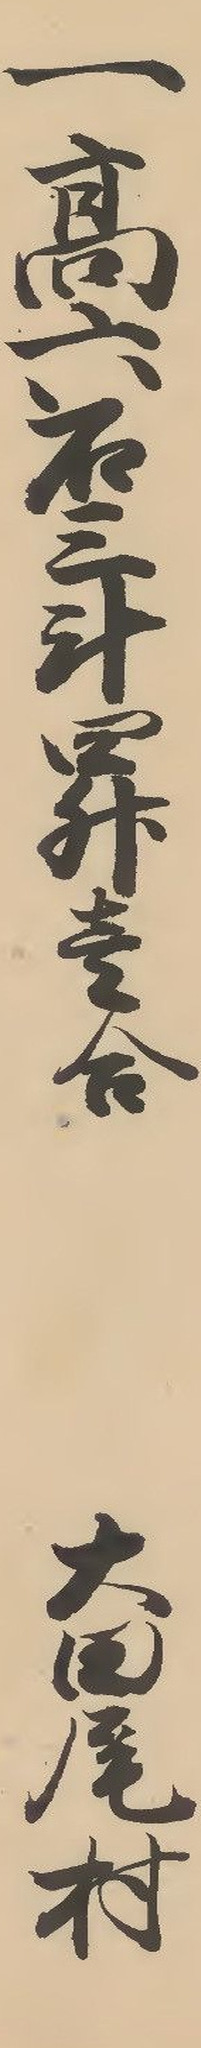一髙六石三斗四升壱合大田尾村
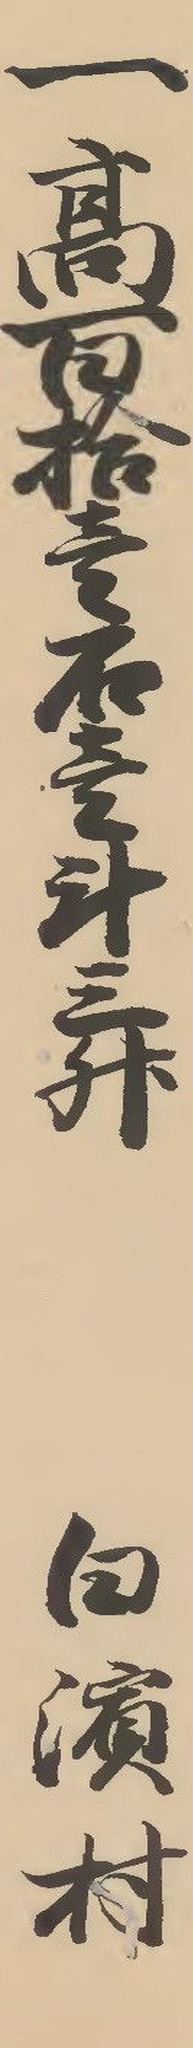一髙百拾壱石壱斗三升白濱村
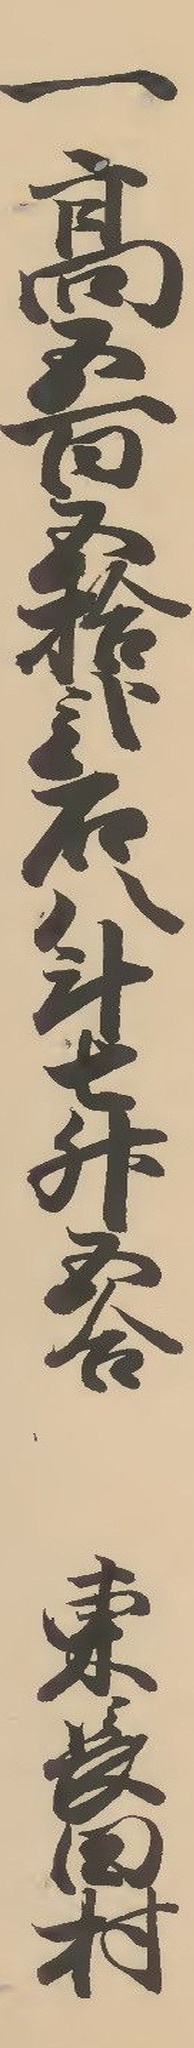一髙五百五拾弐石八斗七升五合東長田村
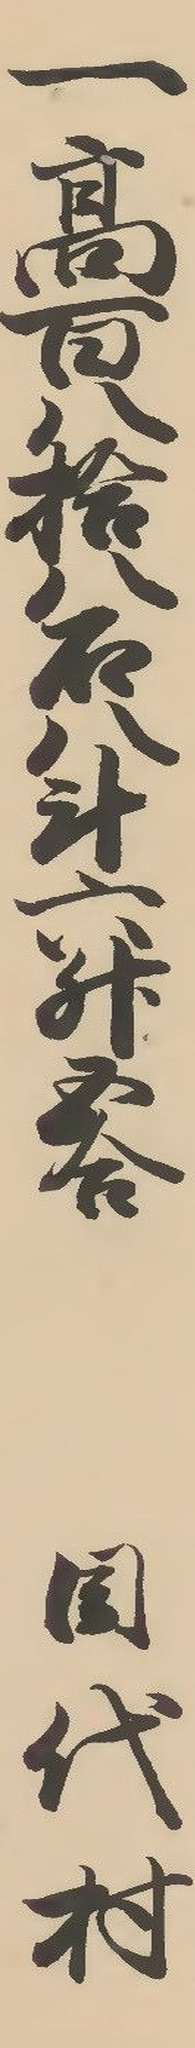一髙百八拾八石八斗六升五合田代村
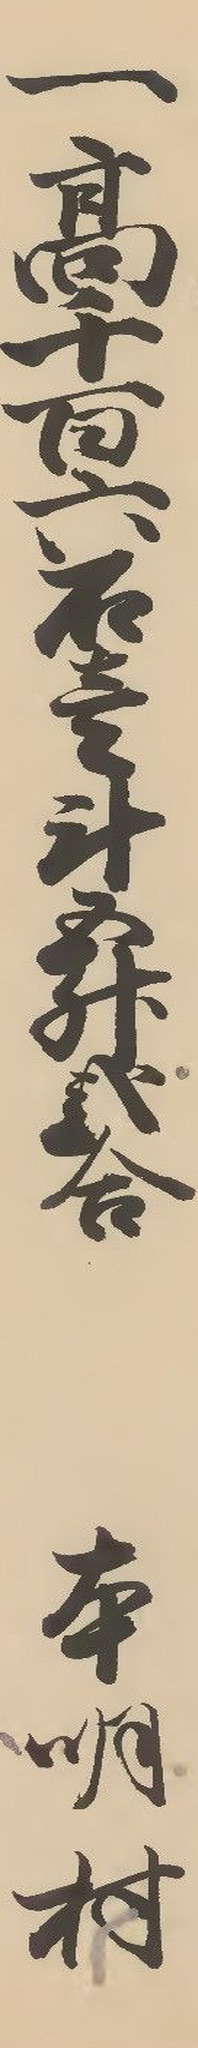一髙千百六石壱斗五升弐合本明村
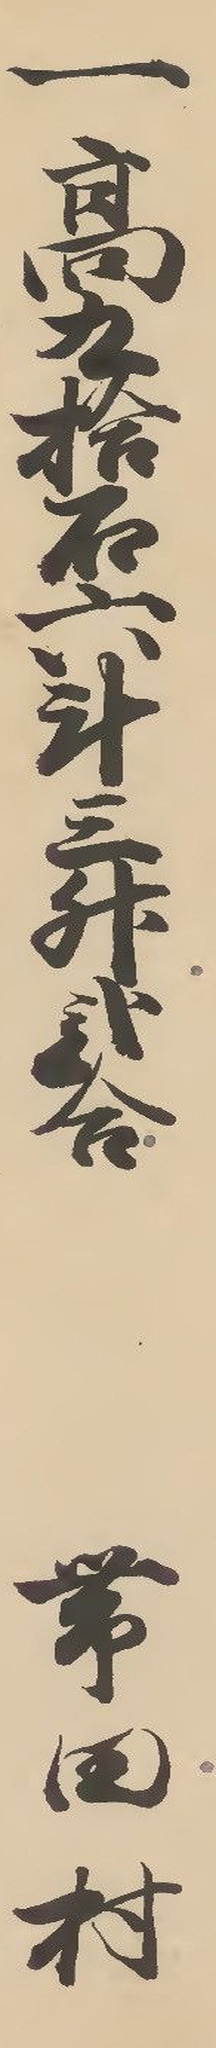一髙九拾石六斗三升弐合帯田村
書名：肥前国郷帳
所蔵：国立公文書館 National Archives of Japan
